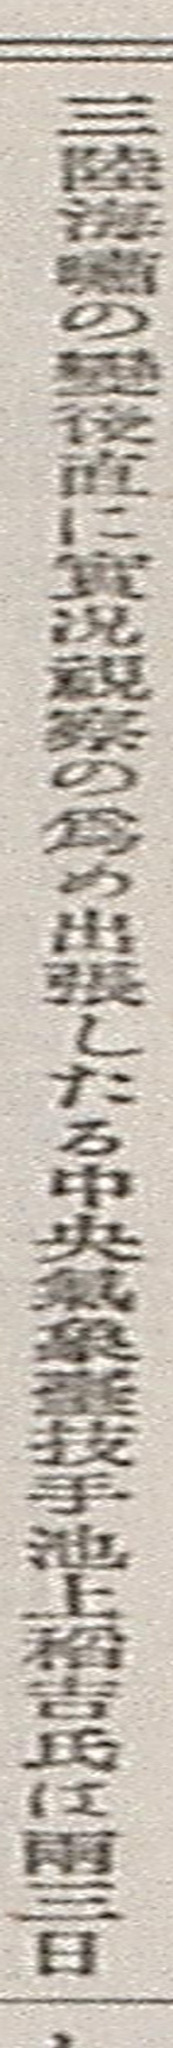三陸海嘯の変後直に実况観察の為め出張したる中央気象台技手池上稲吉氏は両三日
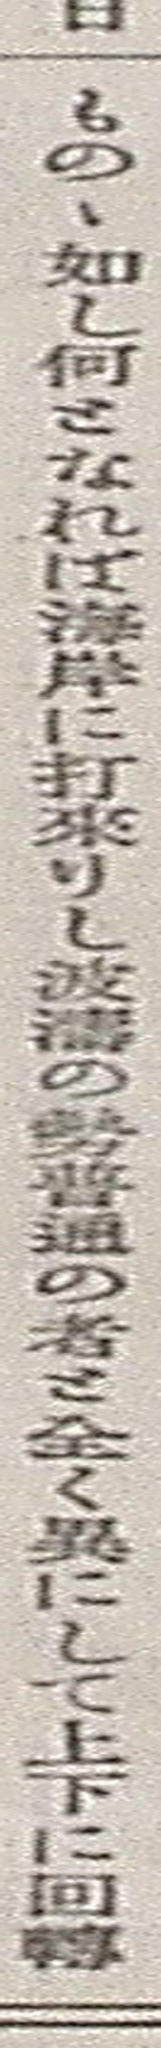ものゝ如し何となれば海岸に打来りし波濤の勢普通の者と全く異にして上下に回転
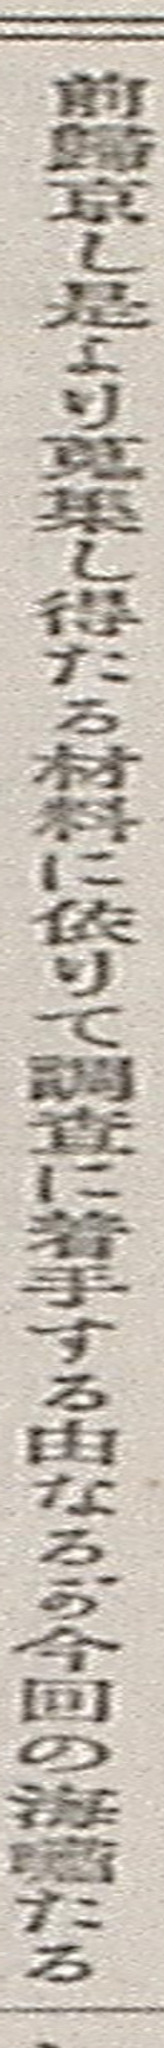前帰京し是より蒐集し得たる材料に依りて調査に着手する由なるが今回の海嘯たる
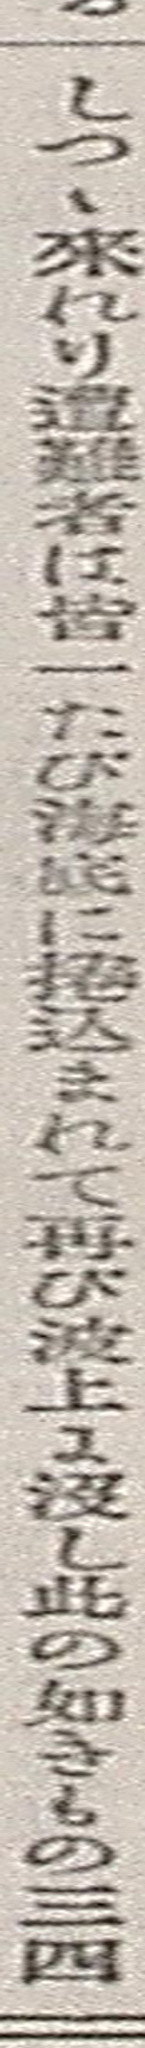しつゝ来れり遭難者は皆一たび海底に捲込まれて再び波上に没し此の如きもの三四
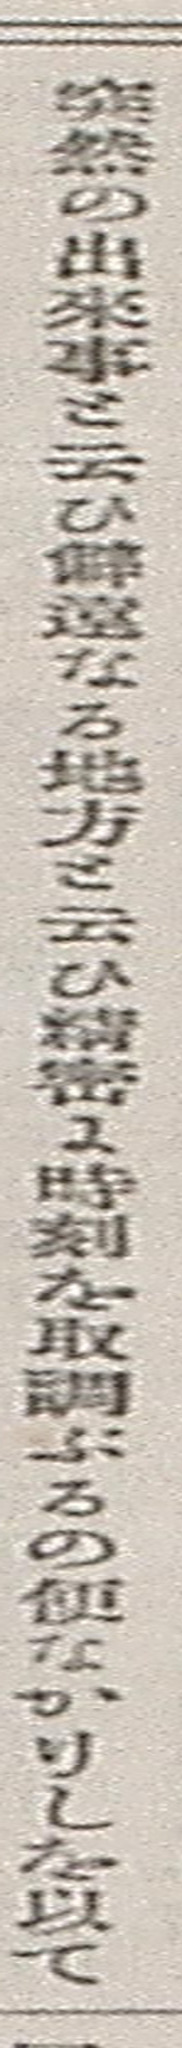突然の出来事と云ひ僻遠なる地方と云ひ精密に時刻を取調ぶるの便なかりしを以て
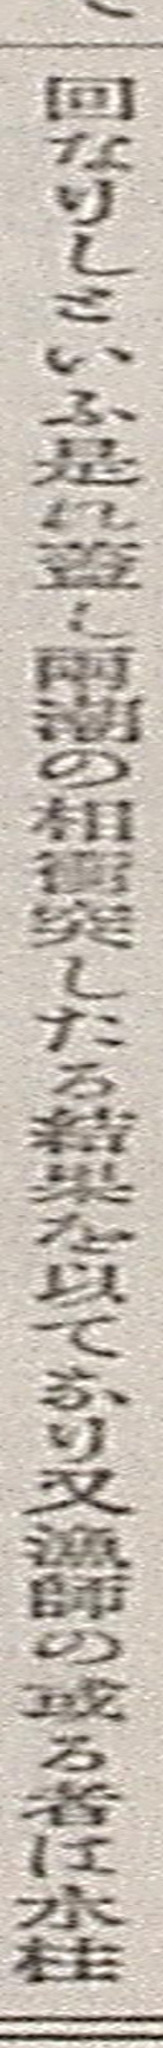回なりしといふ是れ蓋し両潮の相衝突したる結果を以てなり又漁師の或る者は水柱
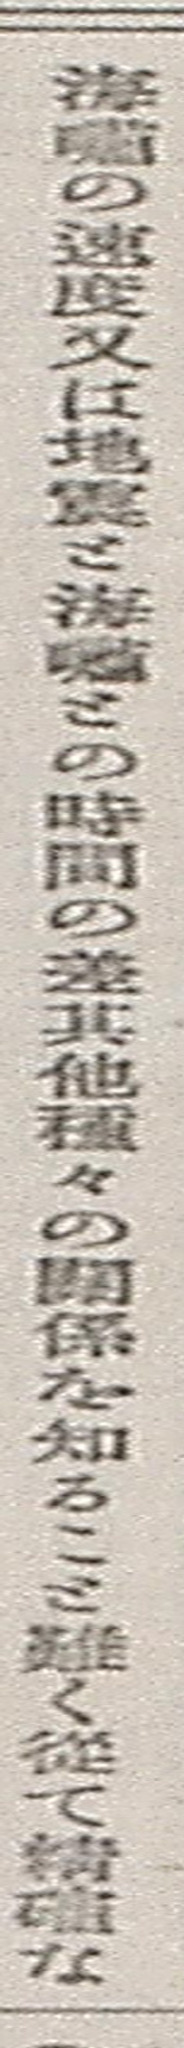海嘯の速度又は地震と海嘯との時間の差其他種々の関係を知ること難く従て精確な
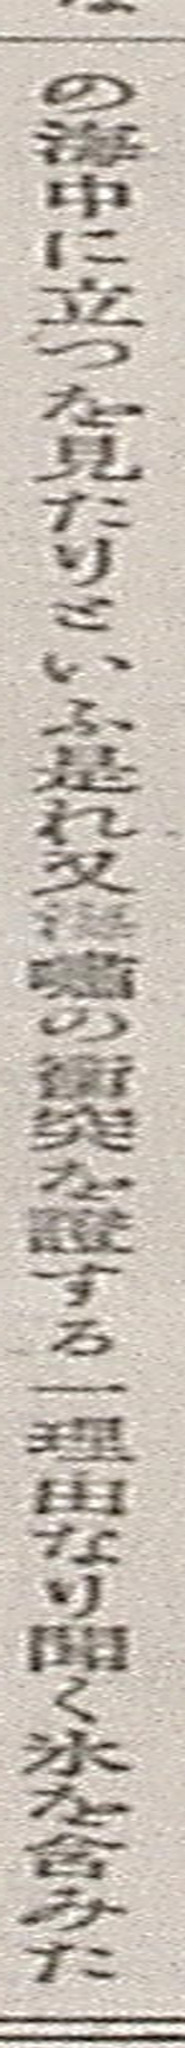の海中に立つを見たりといふ是れ又海嘯の衝突を証する一理由なり聞く氷を含みた
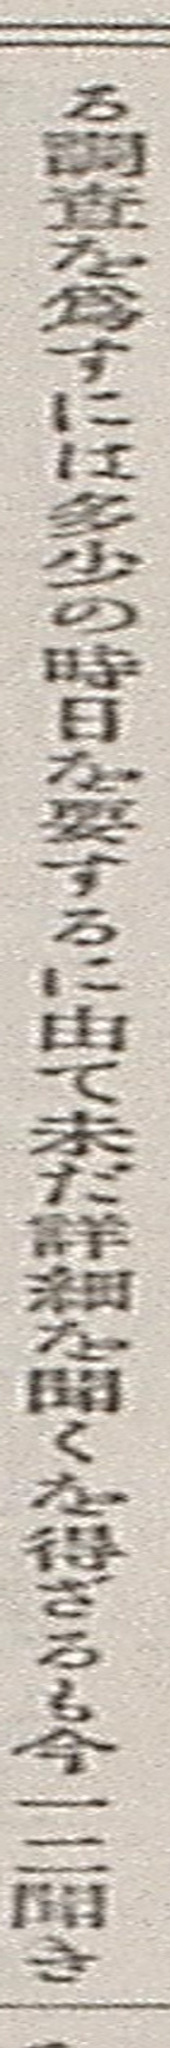る調査を為すには多少の時日を要するに由て未だ詳細を聞くを得ざるも今一二聞き
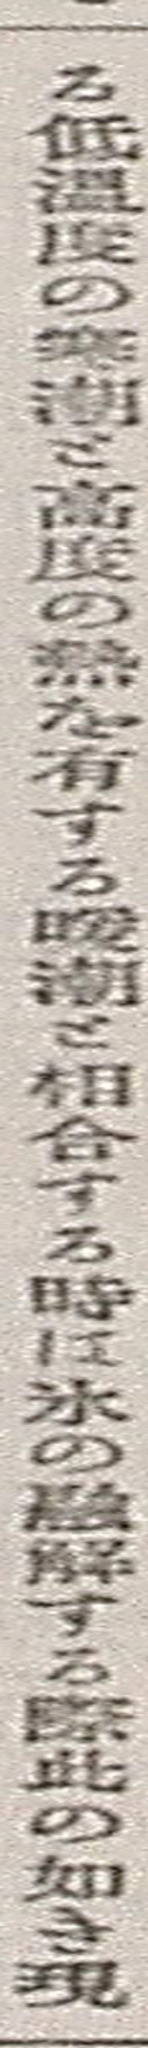る低温度の寒潮と高度の熱を有する暖潮と相合する時は氷の融解する際此の如き現
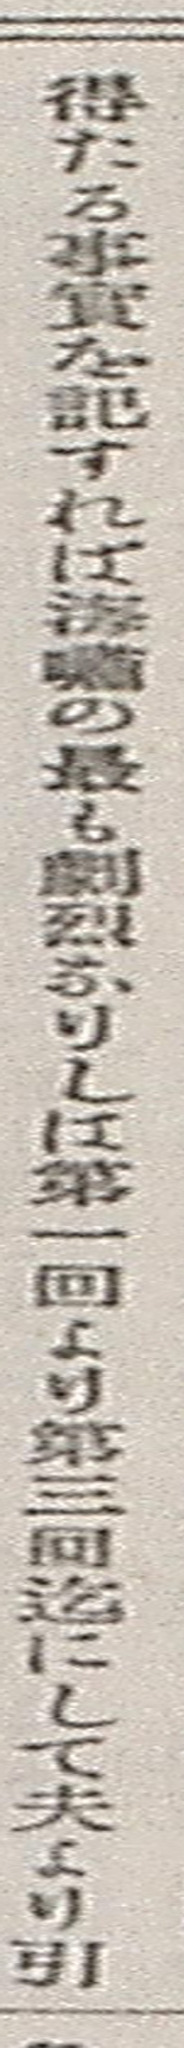得たる事実を記すれば海嘯の最も劇烈なりしは第一回より第三回迄にして夫より引
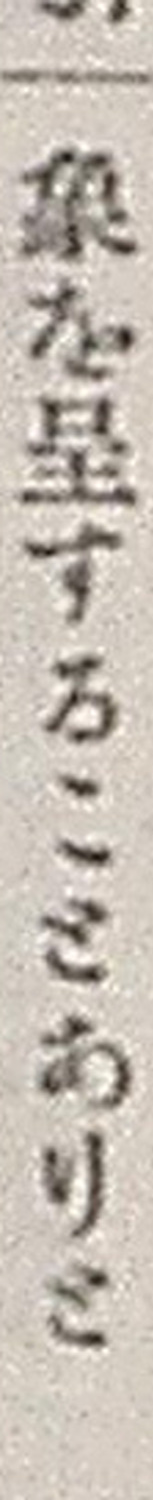象を呈することありと
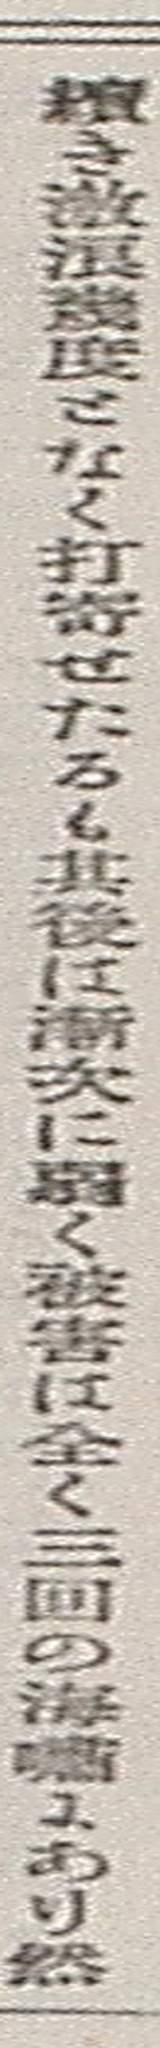続き激浪幾度となく打寄せたるも其後は漸次に弱く被害は全く三回の海嘯にあり然
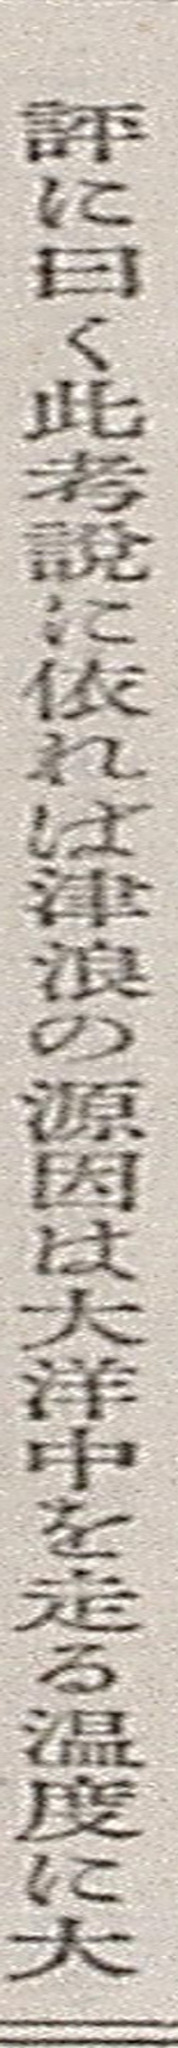評に曰く此考説に依れば津浪の源因は大洋中を走る温度に大
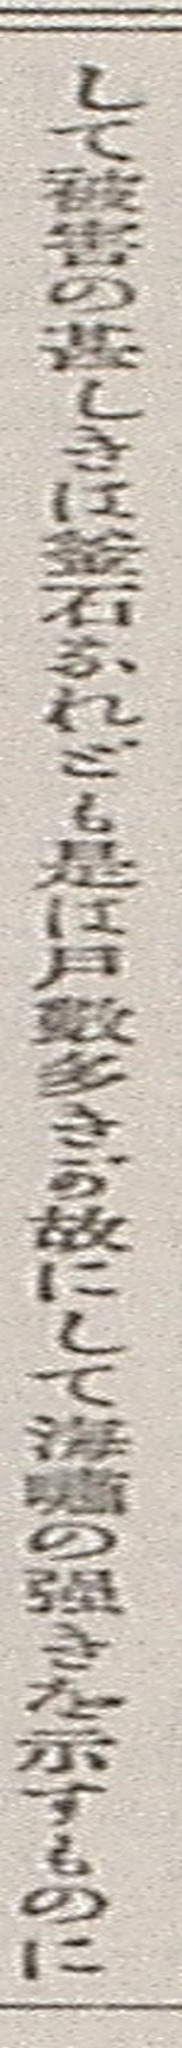して被害の甚しきは釜石なれども是は戸数多きが故にして海嘯の強きを示すものに
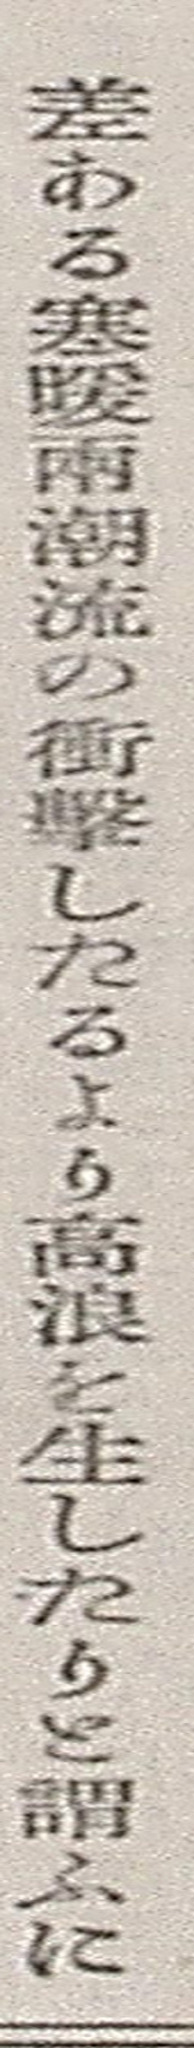差ある寒暖両潮流の衝撃したるより高浪を生したりと謂ふに
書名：風俗畫報臨時増刊第百十九號　大海嘯被害録（中）
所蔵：東京大学地震研究所図書室 Earthquake Research Institute Library, The University of Tokyo, JAPAN
